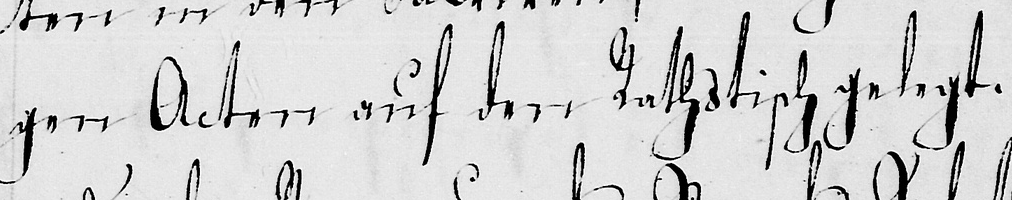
igen Acten auf den Rathstisch gelegt.
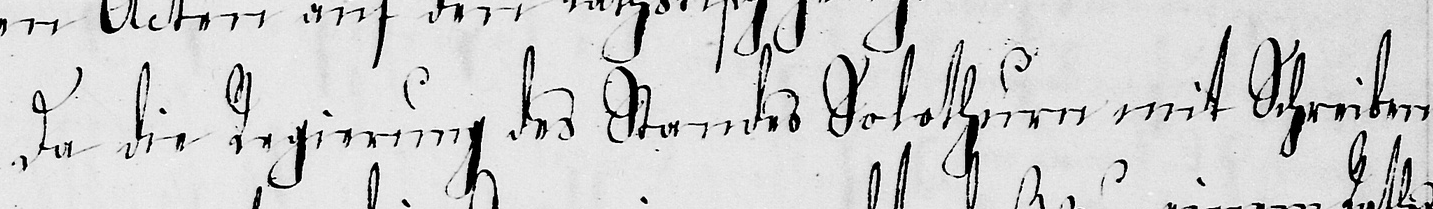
Da die Regierung des Standes Solothurn mit Schreiben
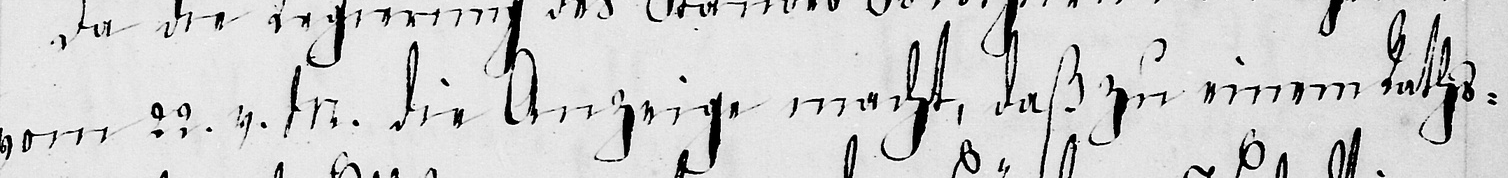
vom 22. v. M. die Anzeige macht, daß zu einem Raths¬
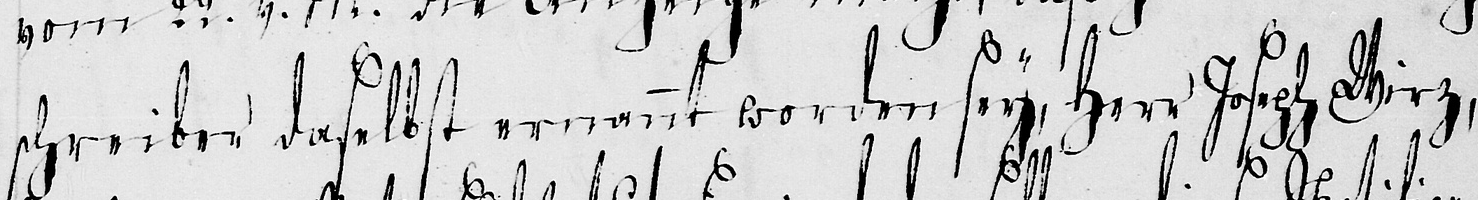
schreiber daselbst ernannt worden sey, Herr Joseph Wirz,
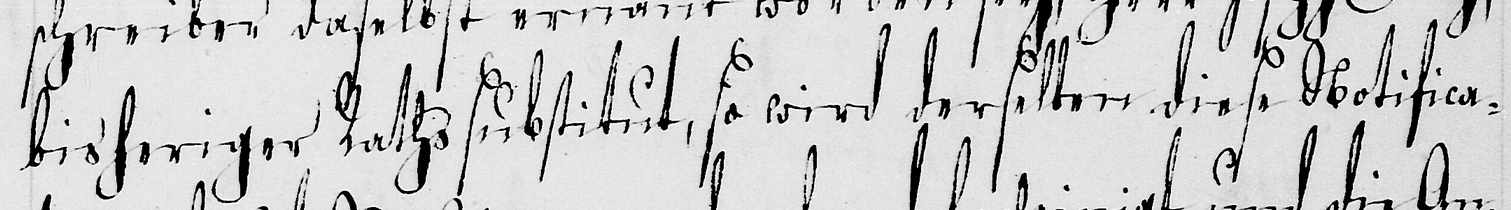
bisheriger Rathssubstitut, so wird derselben diese Notifica¬
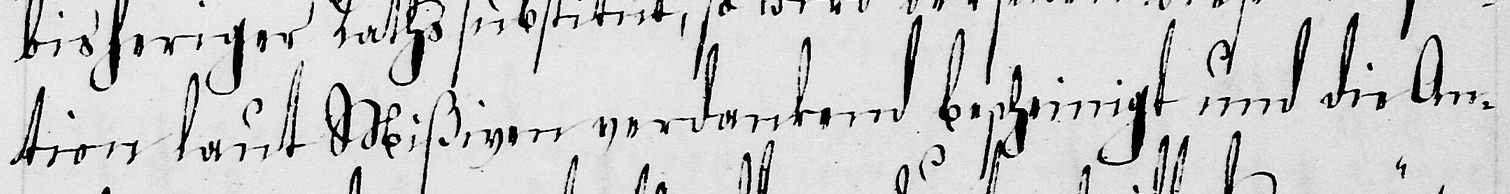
tion laut Mißiven verdankend bescheinigt und die An¬
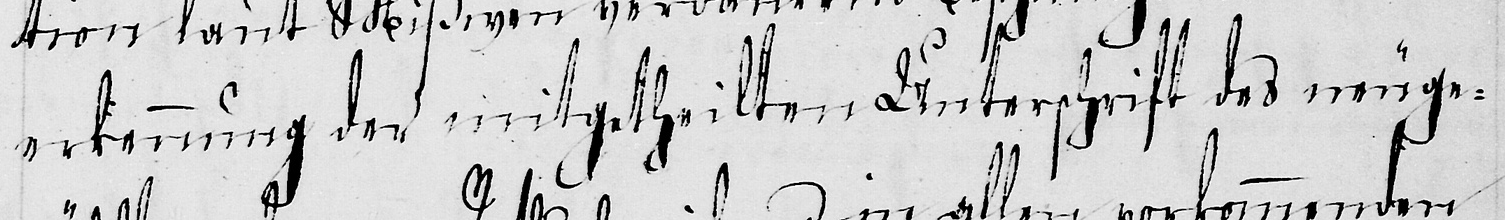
erkennung der mitgetheilten Unterschrift des neuge¬
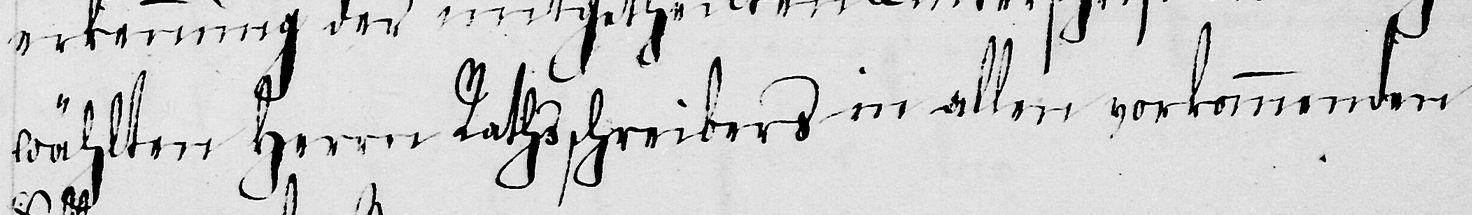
wählten Herrn Rathsschreibers in allen vorkommenden
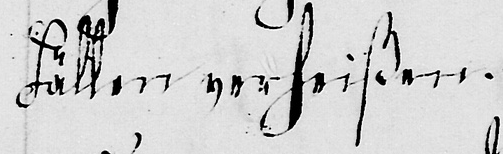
Fällen verheißen.
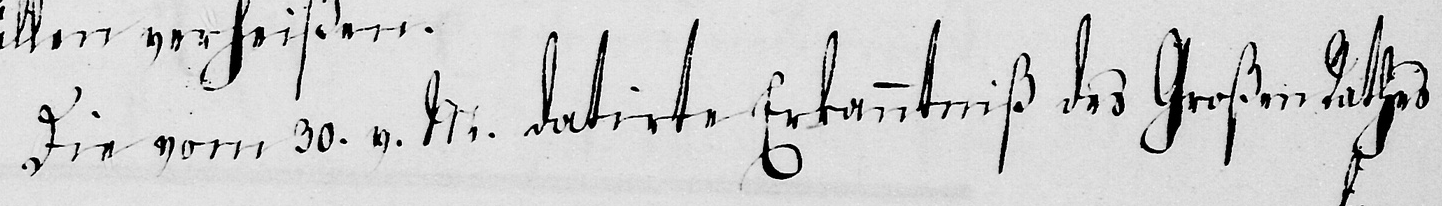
Die vom 30. v. M. datirte Erkanntniß des Großen Rathes
